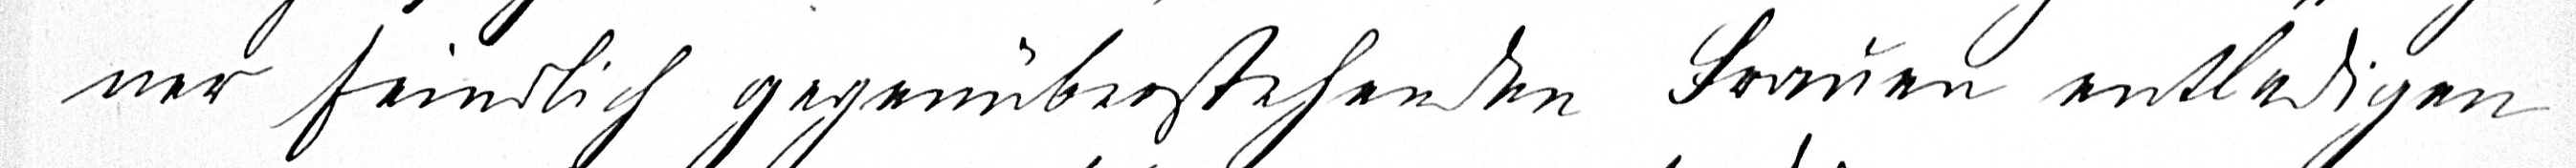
ner feindlich gegenüberstehenden Frauen entledigen
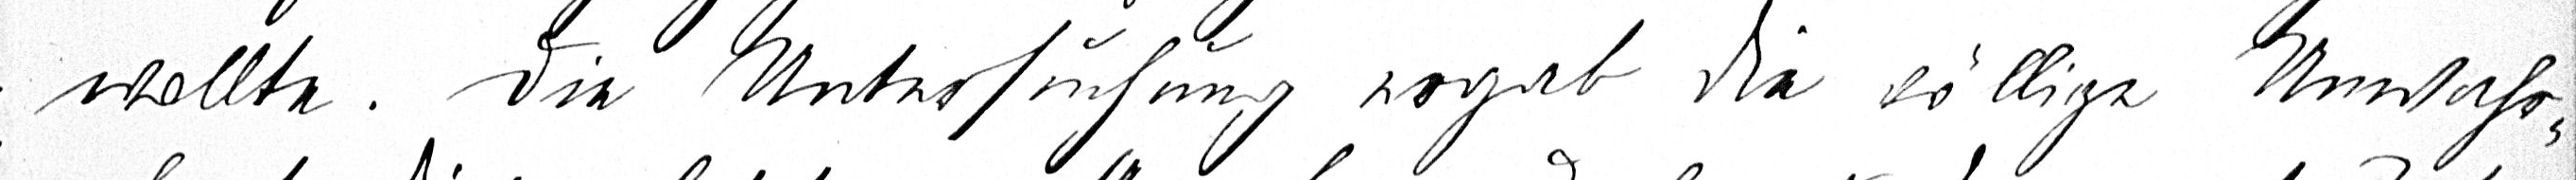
wollte. Die Untersuchung ergab die völlige Unwahr¬
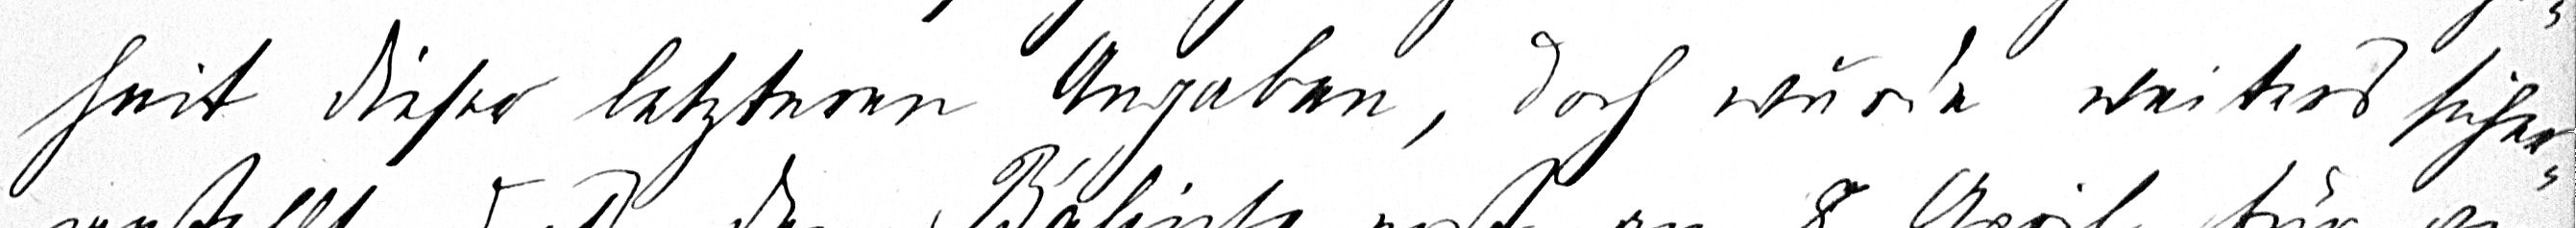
heit dieser letzteren Angaben, doch wurde weiters sicher¬
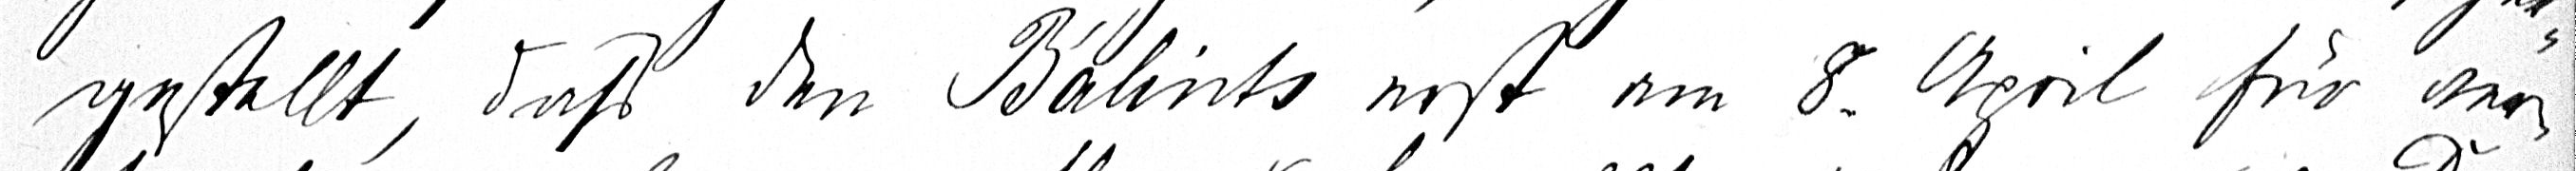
gestellt, dass den Bálints erst am 8. April für ver¬
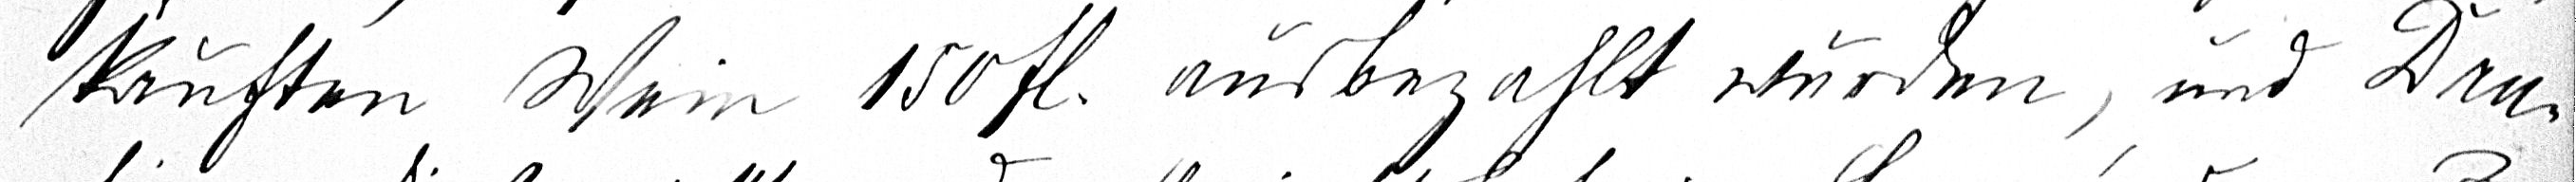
kauften Wein 150 fl. ausbezahlt wurden, und Dru¬
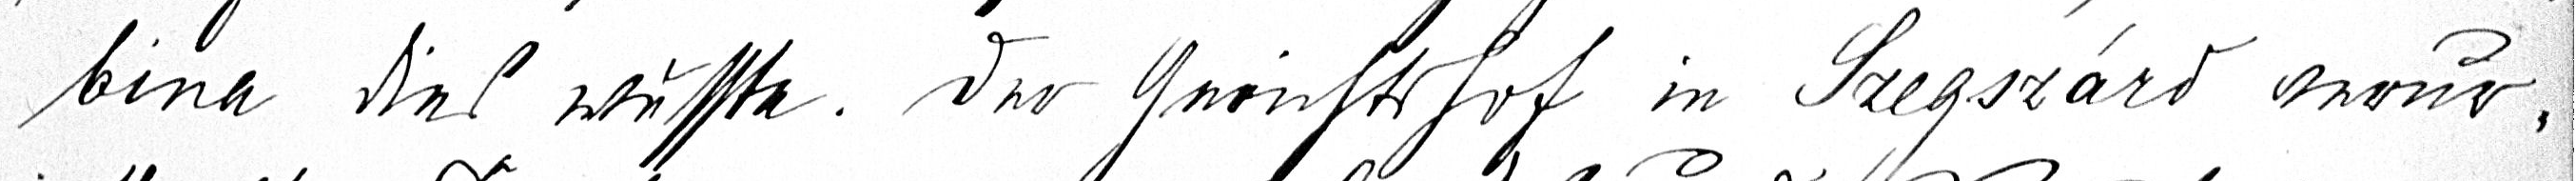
bina dies wusste. Der Gerichtshof in Szegszárd verur¬
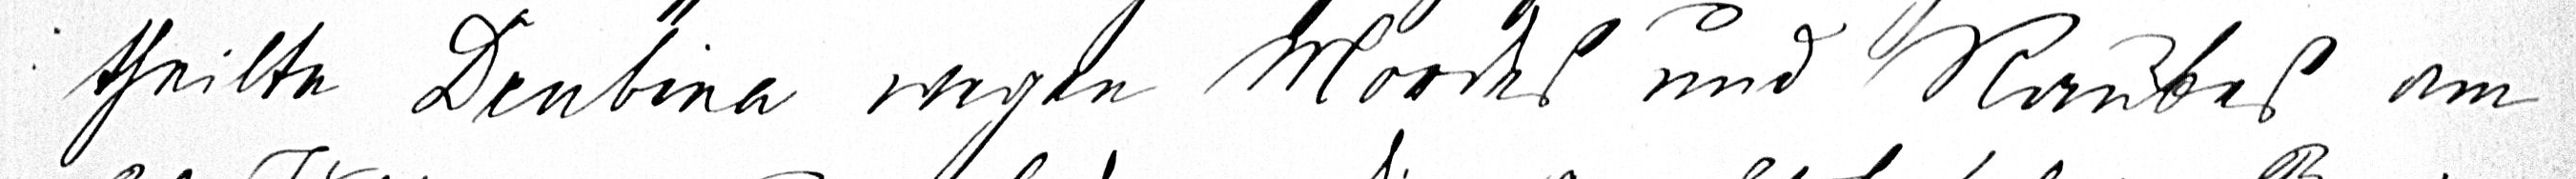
theilte Drubina wegen Mordes und Raubes am
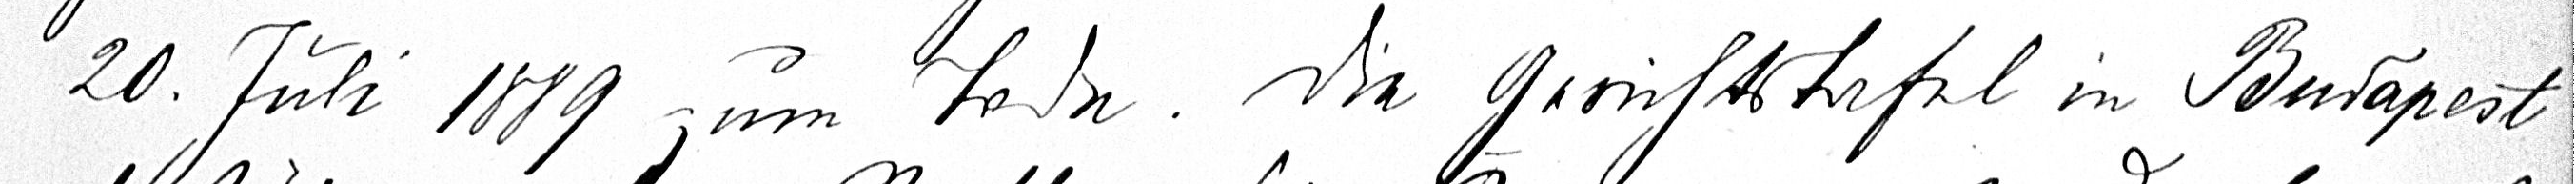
20. Juli 1889 zum Tode. Die Gerichtstafel in Budapest
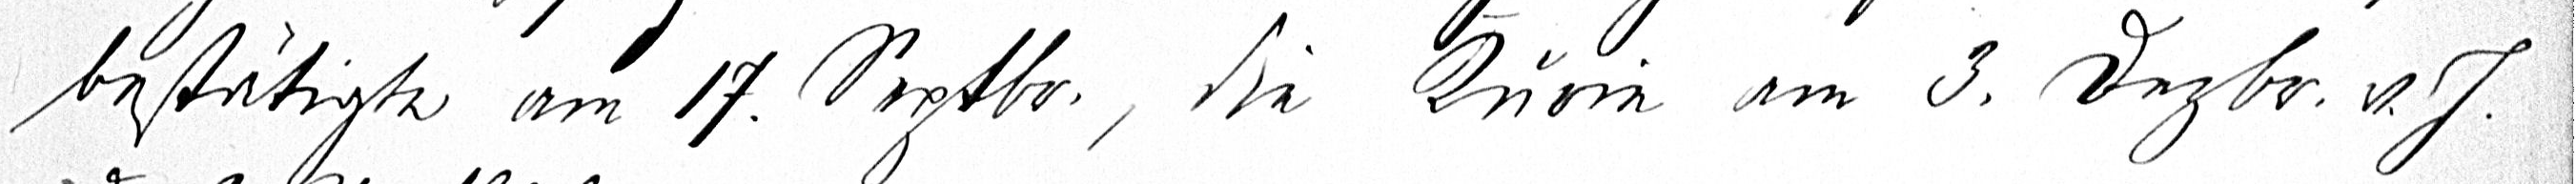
bestätigte am 17. Septbr.,die Kurie am 3. Dezbr. v. J.
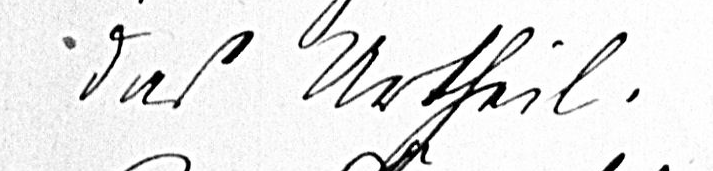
das Urtheil.
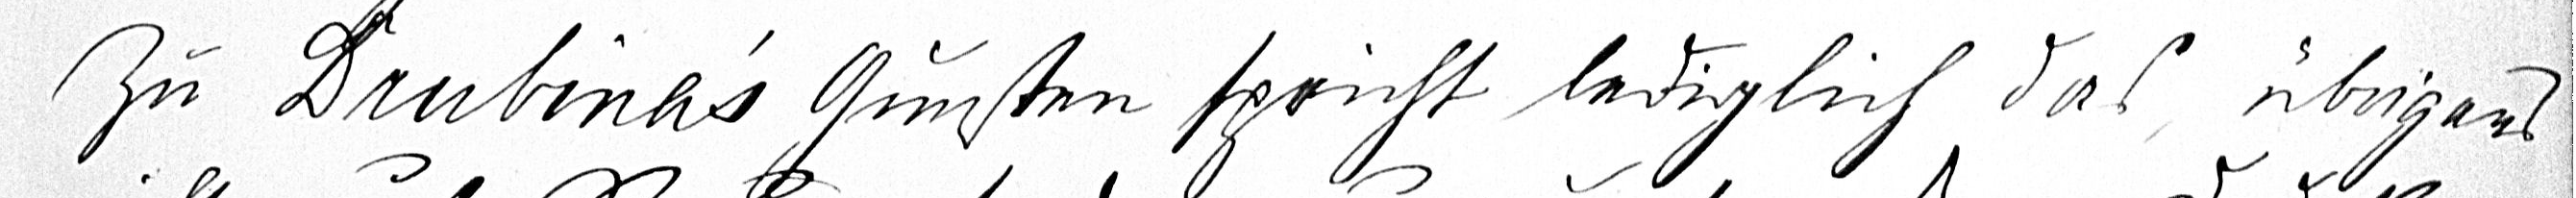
Zu Drubina's Gunsten spricht lediglich das, übrigens
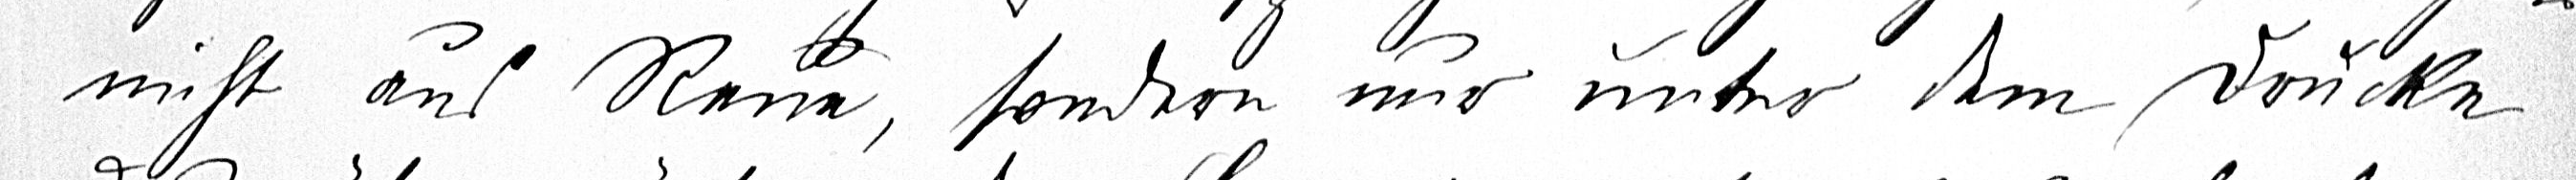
nicht aus Reue, sondern nur unter dem Drucke
